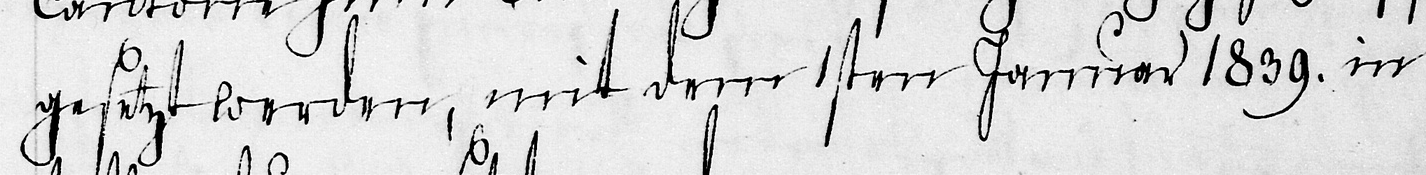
gesetzt werden, mit dem 1sten Januar 1839. in
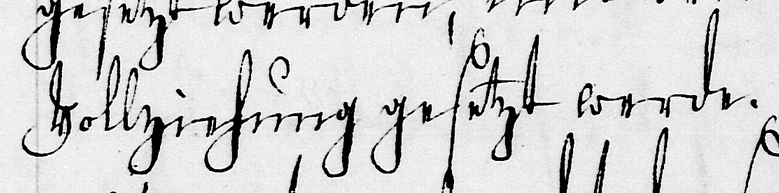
Vollziehung gesetzt werde.
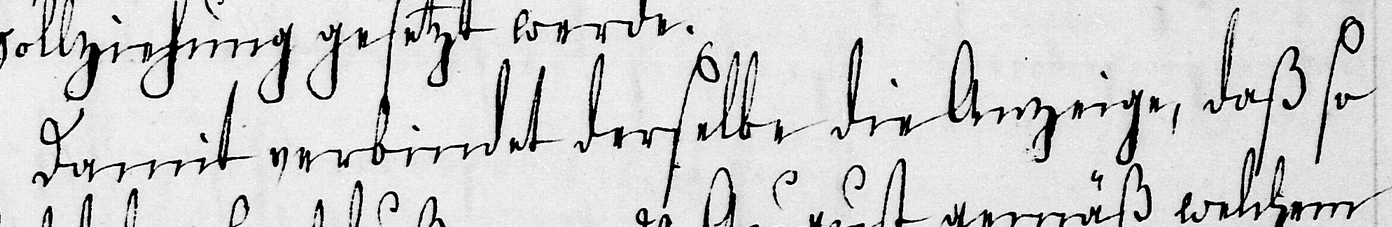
Damit verbindet derselbe die Anzeige, daß so
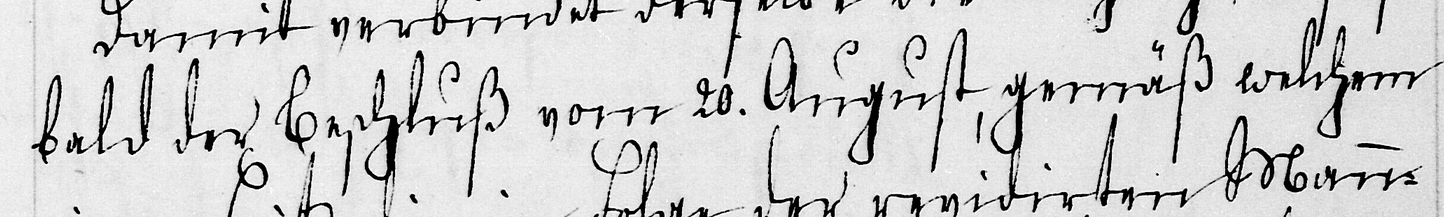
bald der Beschluß vom 20. August, gemäß welchem
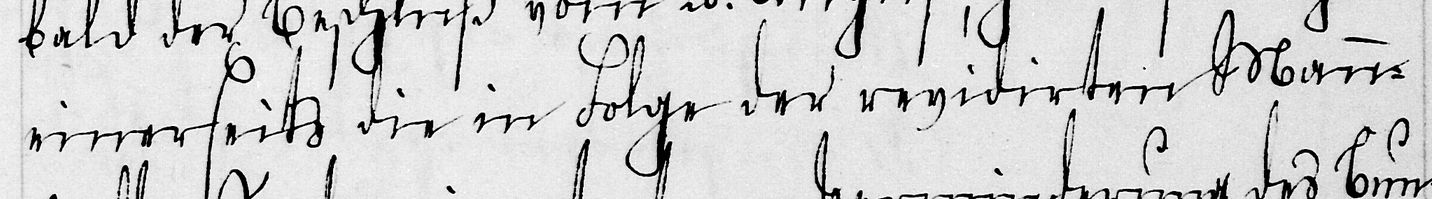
einerseits die in Folge der revidirten Mann¬
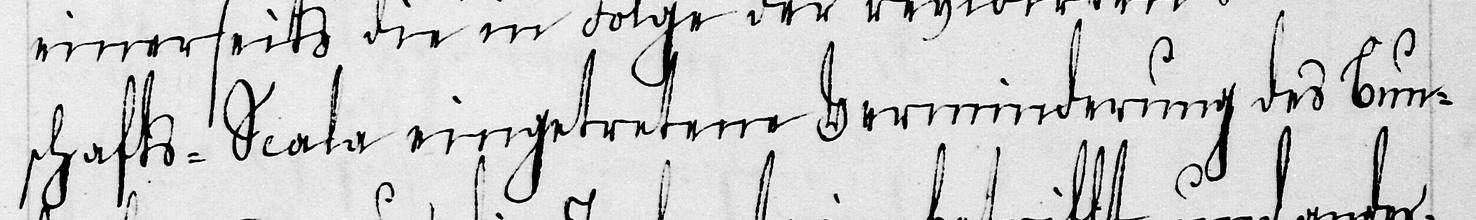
schafts-Scala eingetretene Verminderung des Bun¬
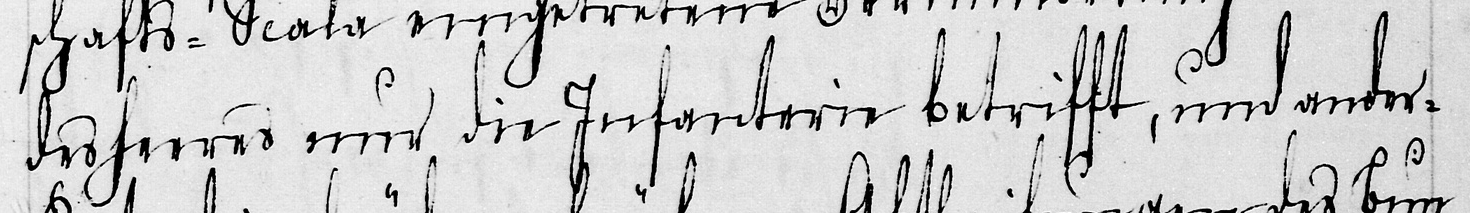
desheeres nur die Infanterie betrifft, und ander¬
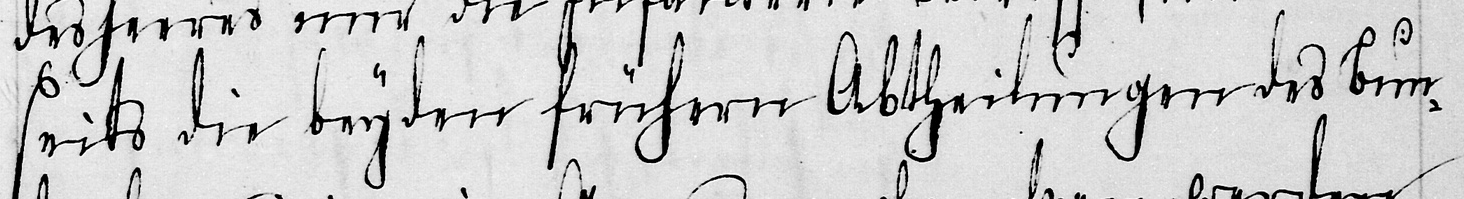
seits die beyden frühern Abtheilungen des Bun¬
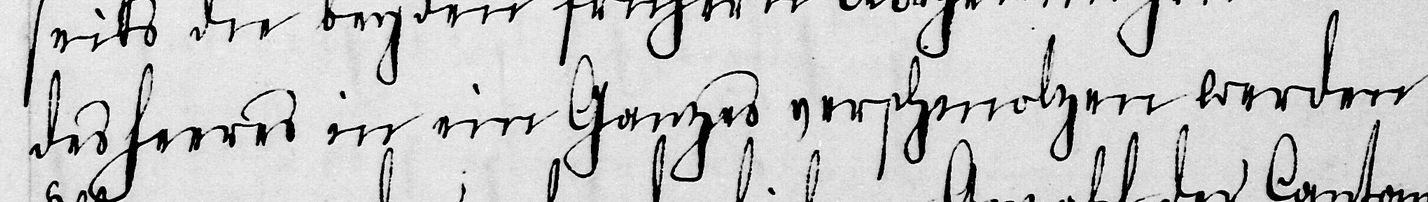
desheeres in ein Ganzes verschmolzen werden
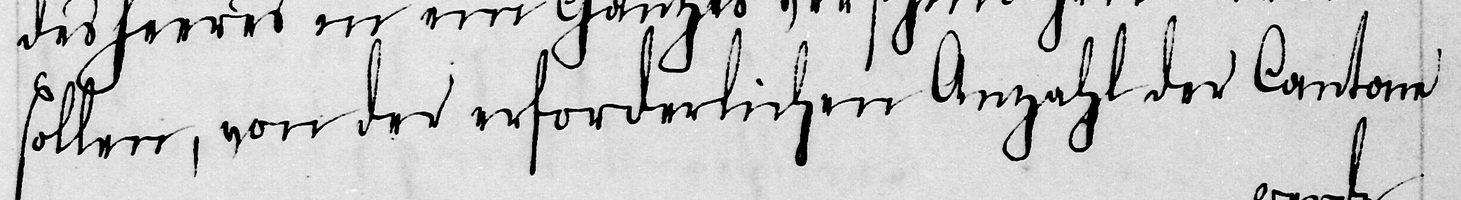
sollen, von der erforderlichen Anzahl der Cantone
